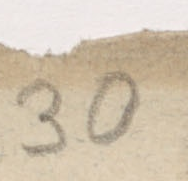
165.
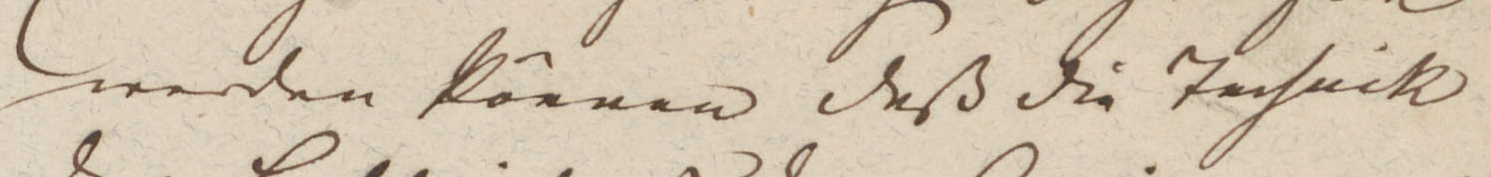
werden können dass die Technik
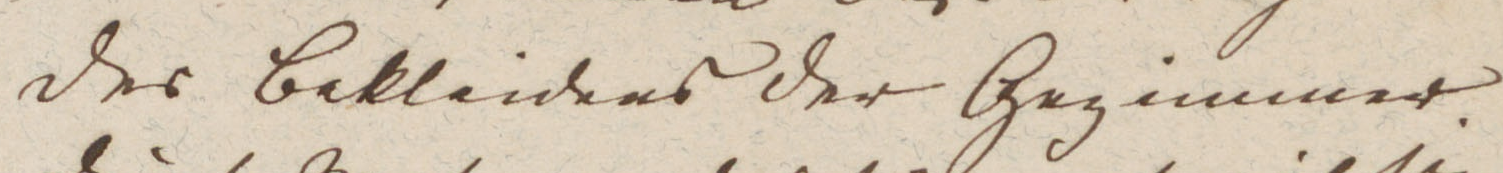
des Bekleidens der Gezimmer
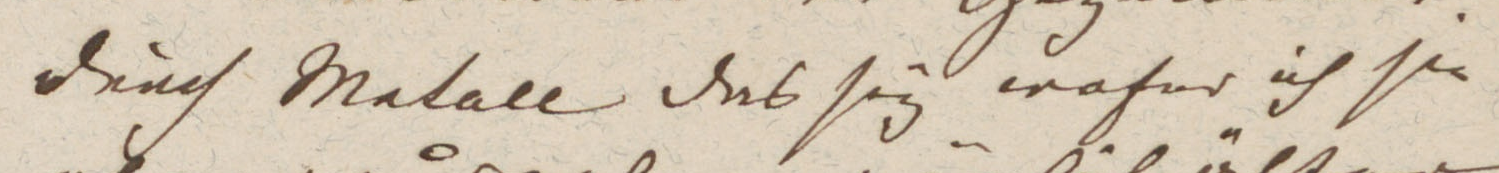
durch Metall das sey woher ich sie
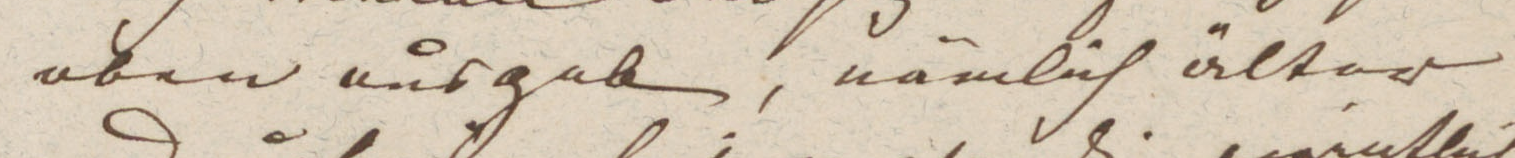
oben ausgab, nämlich älter
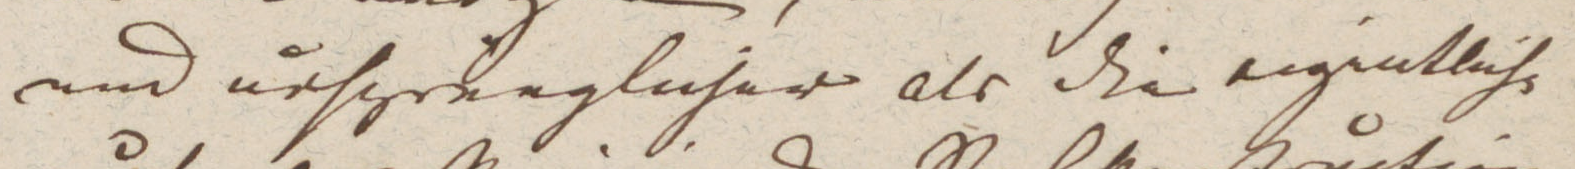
und ursprünglicher als die eigentliche
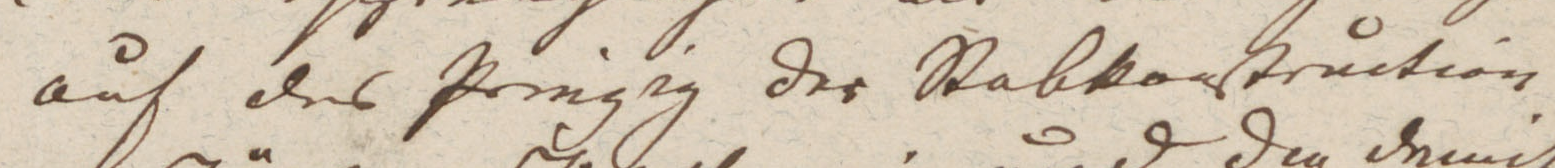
auf das Prinzip der Stabkonstruction
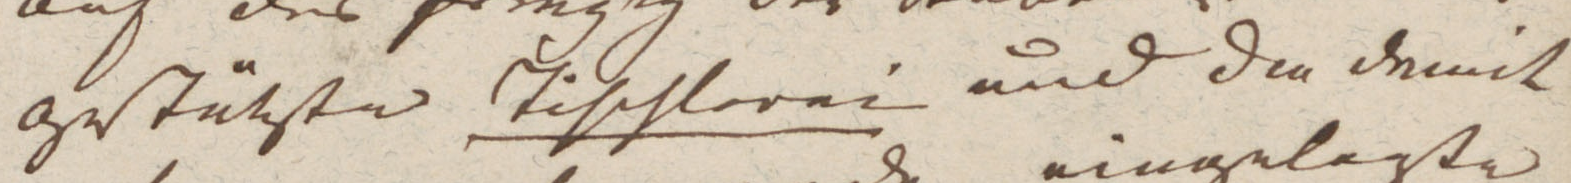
gestützte Tischlerei und die damit
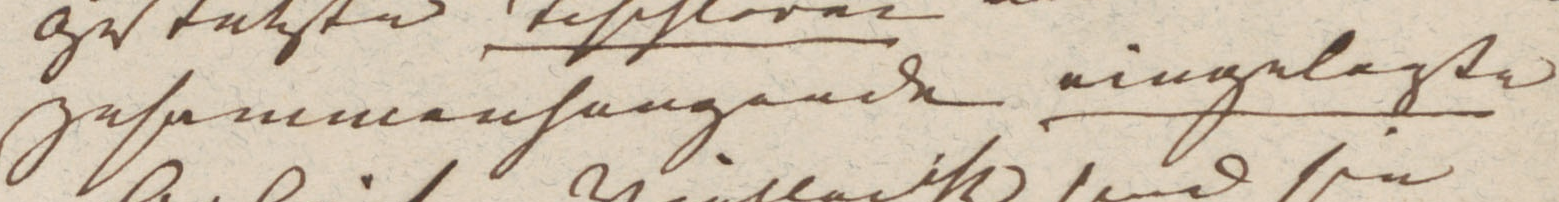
zusmmenhangende eingelegte
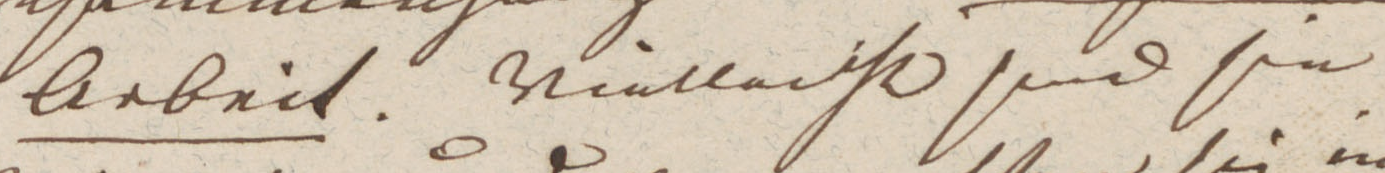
Arbeit. Vielleicht sind sie
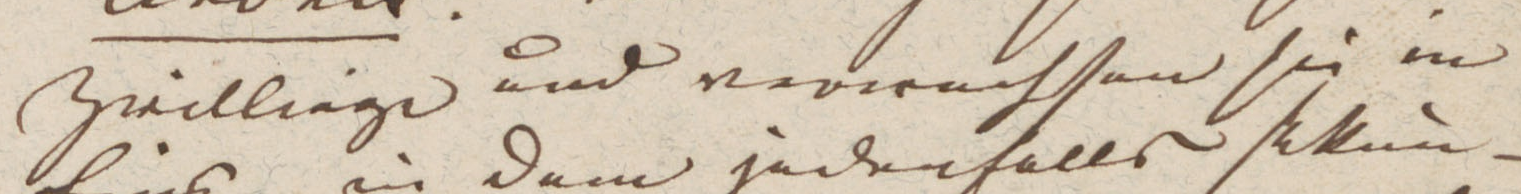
Zwillinge und verwachsen sie in
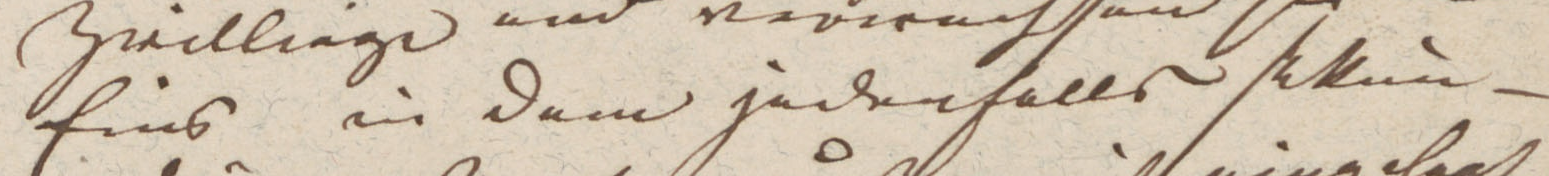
Eins in dem jedenfalls sekun-
